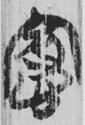愈
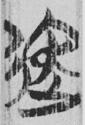○（穾）
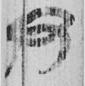尹
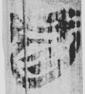智（知）
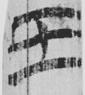王
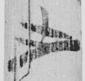之
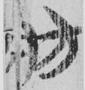○（病）
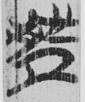乘
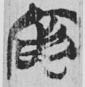龜
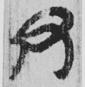尹
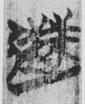速
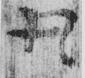卜
